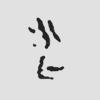水
